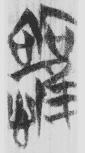懽
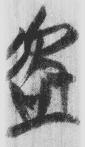唬
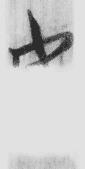女
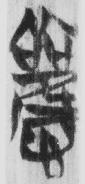懽
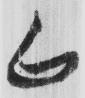㠯（以）
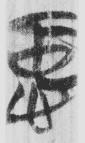忠
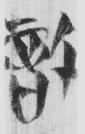信
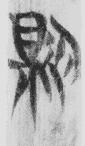則
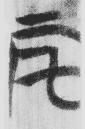厇
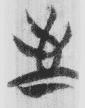至
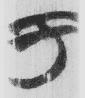于
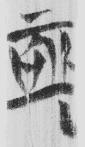亟
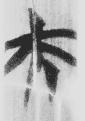夫
